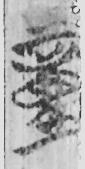童
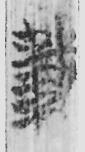載
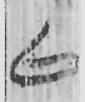㠯（以）
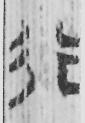行
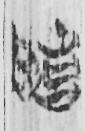{阜青}
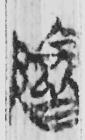險
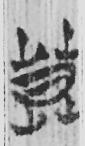莫
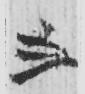之
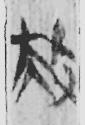{夫攴}
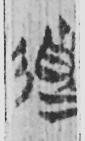道
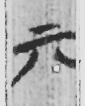亓
